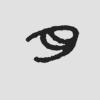月
